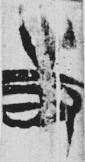時
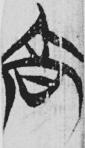高
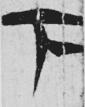下
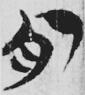肥
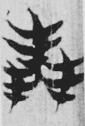毳
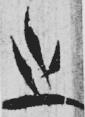之
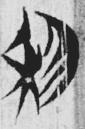利（利）
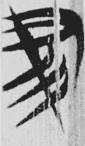○（盡）
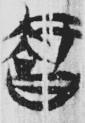智（知）
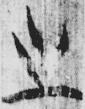之
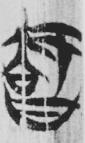智（知）
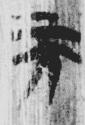天
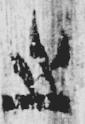之
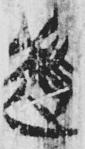道
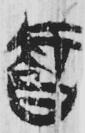智（知）
